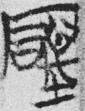○（厲）
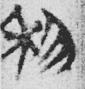利
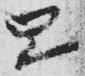巳
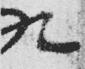九
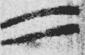二
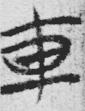車
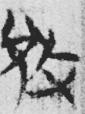敓（說）
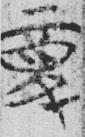复（輹）
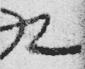九
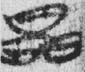晶
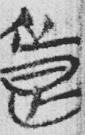良
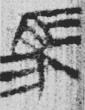馬
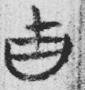由（逐）
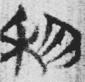利
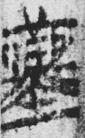堇（艱）
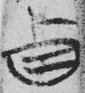貞
